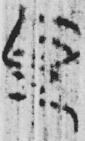見
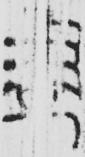者
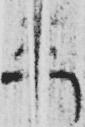之
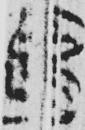胃（謂）
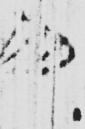勿（物）
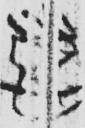快
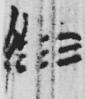於
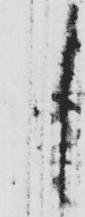其（己）
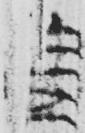者
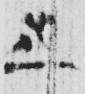之
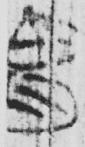胃（謂）
